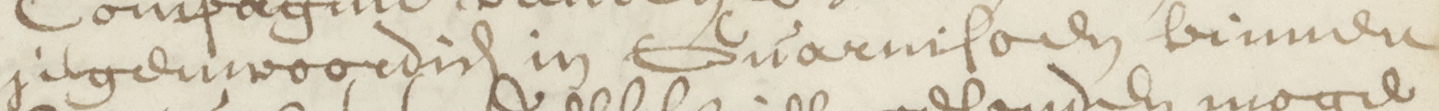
jegenwoordich in Guarnisoen binnen
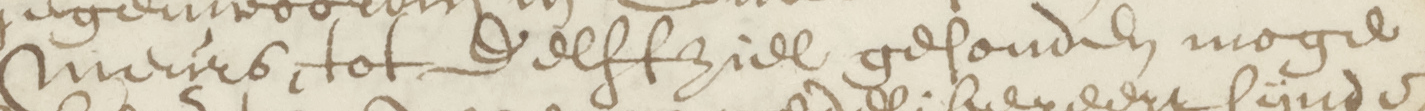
Meurs, tot Delffziel gesonden moge
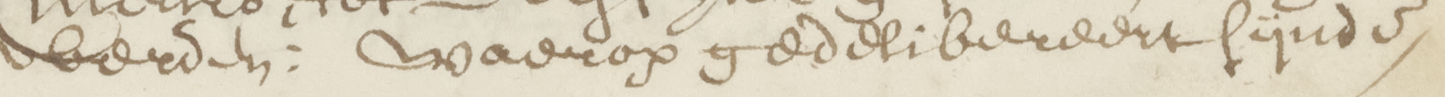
werden: Waerop gedelibereert sijnde,
